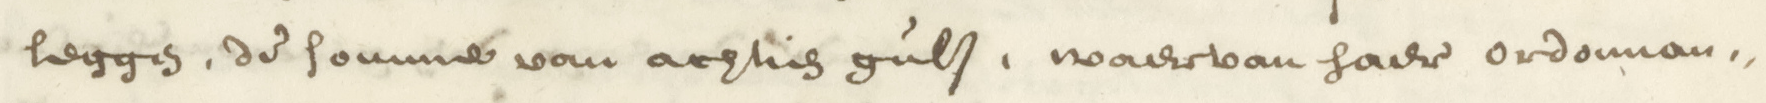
leggen, de somme van achtien guls. waervan haer ordonnan„
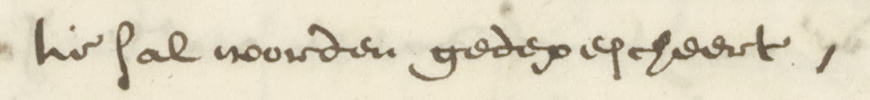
tie sal worden gedepescheert.
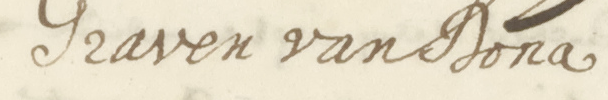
Graven van Dona
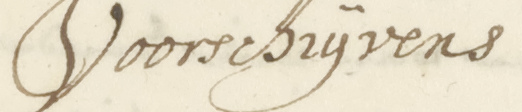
Voorschrijvens
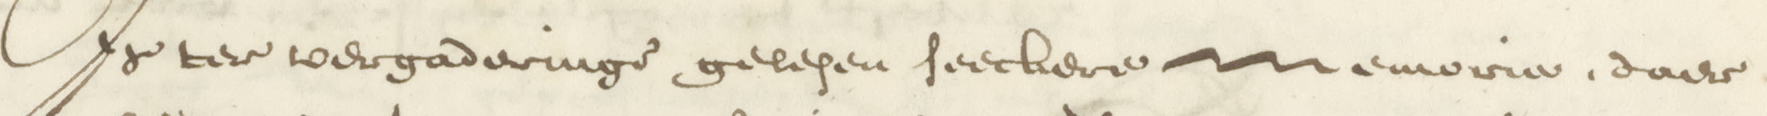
Is ter vergaderinge gelesen seeckere Memorie, daer
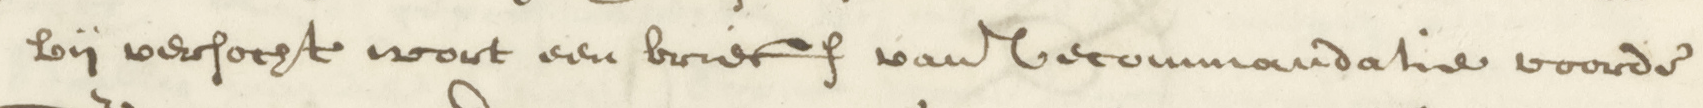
bij versocht wort een brieff van recommandatie voorde
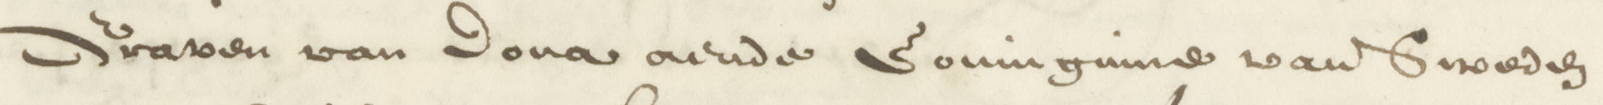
Graven van Dona aende Coninginne van Sweden
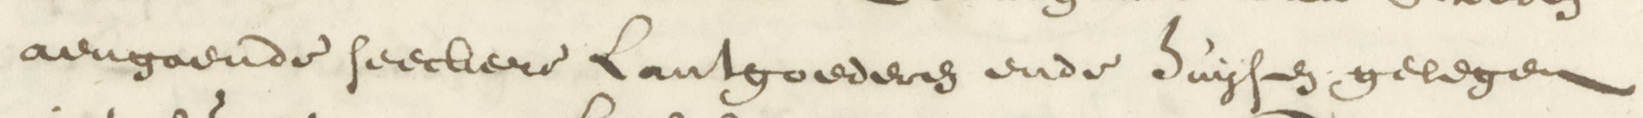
aengoende seeckere Lantgoederen ende huijsen gelegen
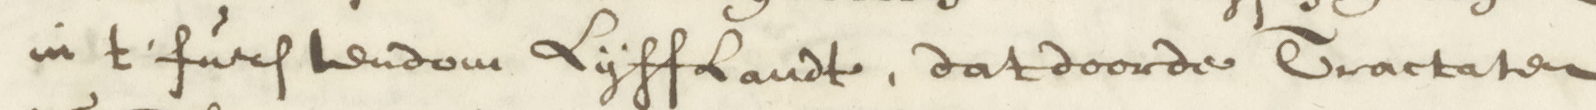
in t' furstendom LijffLandt, dat door de Tractaten
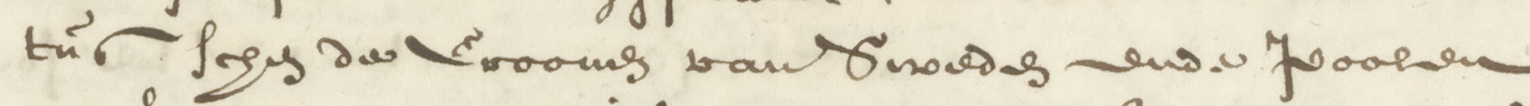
tusschen de Croonen van Sweden ende Poolen
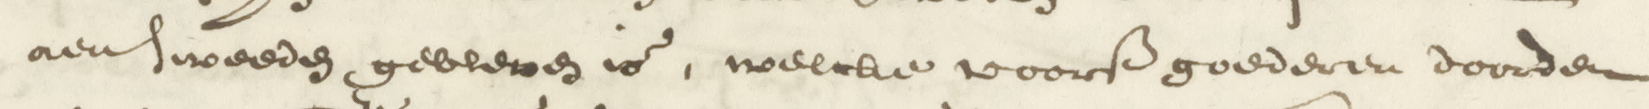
aen sweeden gebleven is, welcke voors goederen doorden
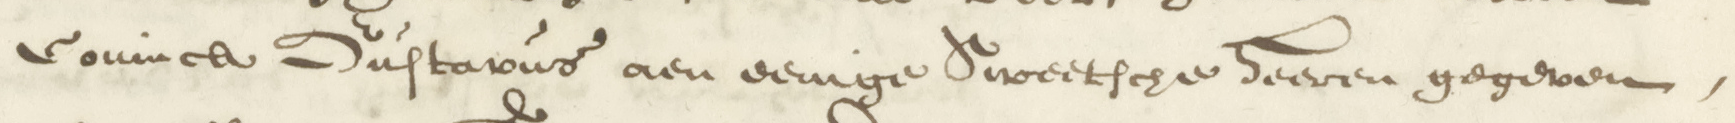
Coninck Gustavus aen eenige Sweetsche heeren gegeven,
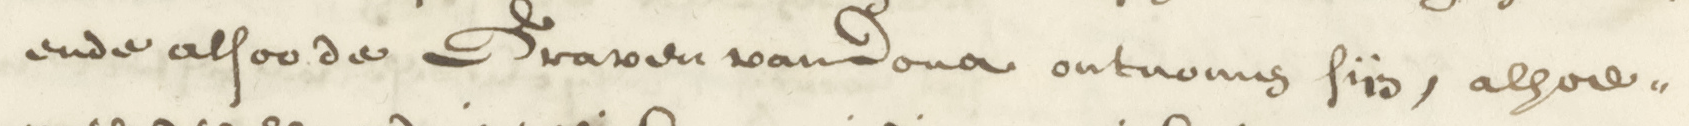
ende alsoo de Graven van dona ontnomen sijn, alhoe„
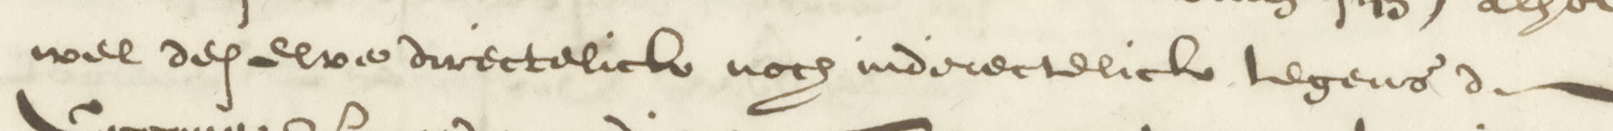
wel deselve directelick noch inderectelick tegens de
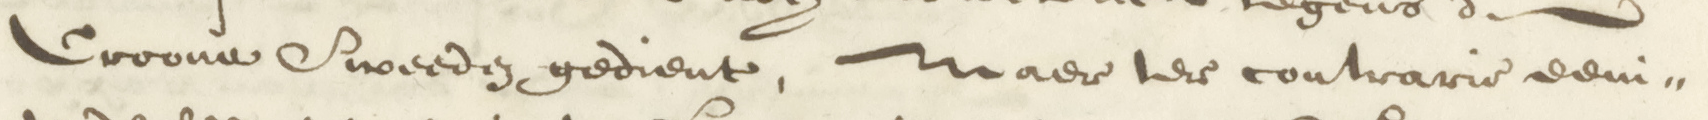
Croone Sweeden gedient, Maer ter contrarie eeni„
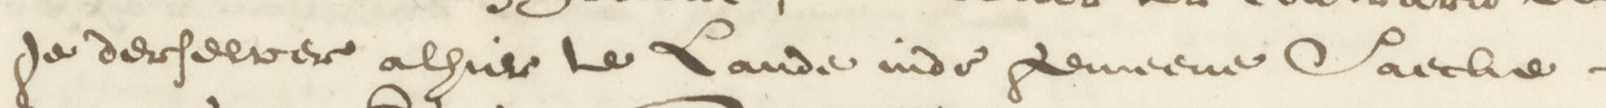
ge derselver alhier te Lande inde gemeene Saecke
